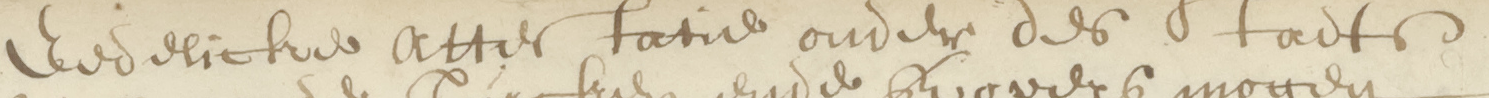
Redelicke Attestatie onder des Stadts
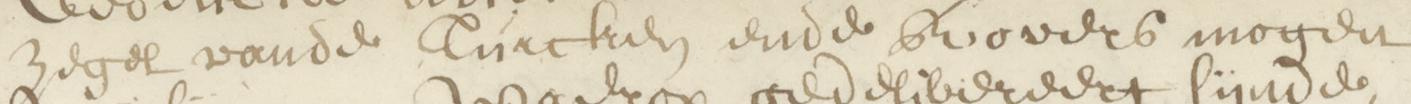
zegel vande Turcken ende Rovers mogen
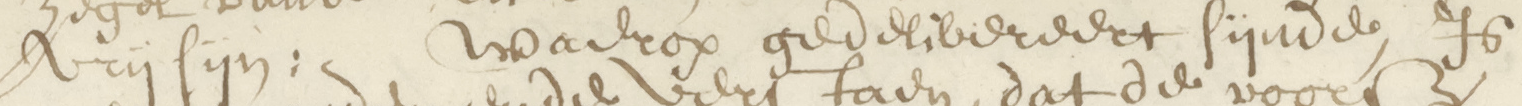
vrij sijn: Waerop gedelibereert sijnde, Is
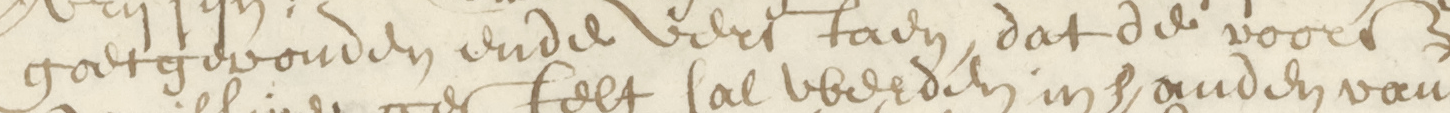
goetgevonden ende verstaen, dat de voorsz
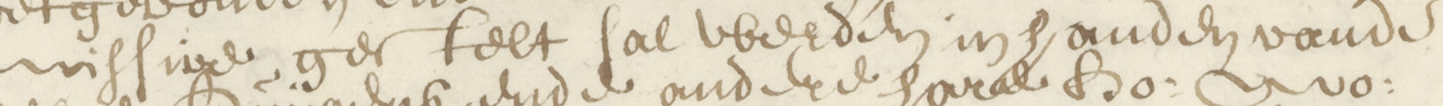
Missive gestelt sal werden in handen vande
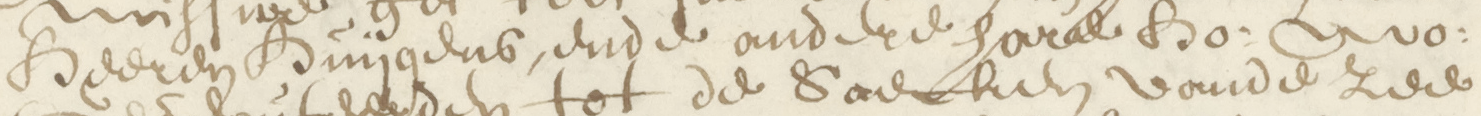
Heeren Huijgens, ende andere hare Ho:Mo:
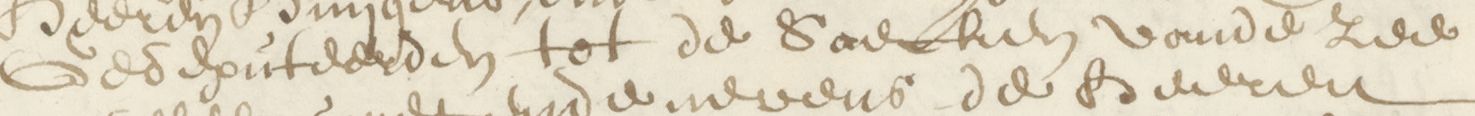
Gedeputeerden tot de Saecken van de Zee
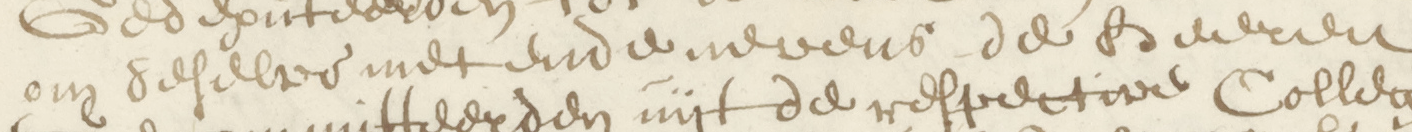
om deselve met ende nevens de Heeren
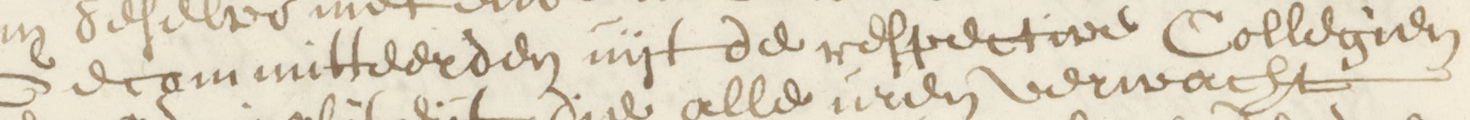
Gecommitteerden uijt de respective Collegien
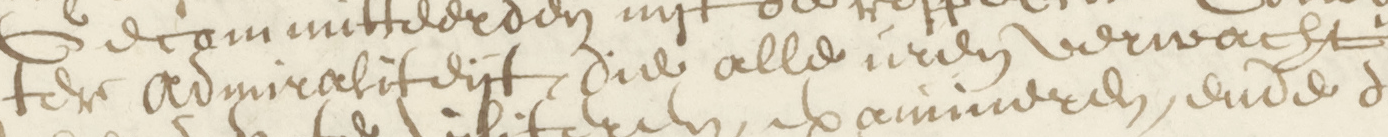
ter Admiraliteijt, die alle uren verwacht
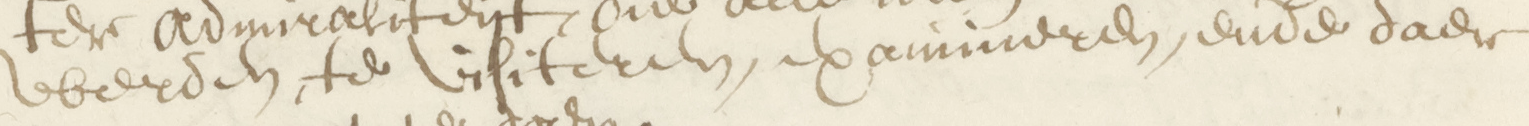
werden, te visiteren, examineren, ende daer
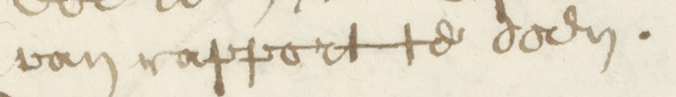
van rapport te doen.
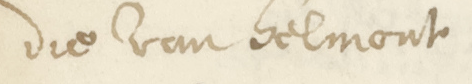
die van Helmont
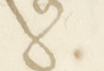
ca.
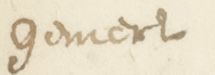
Gemert
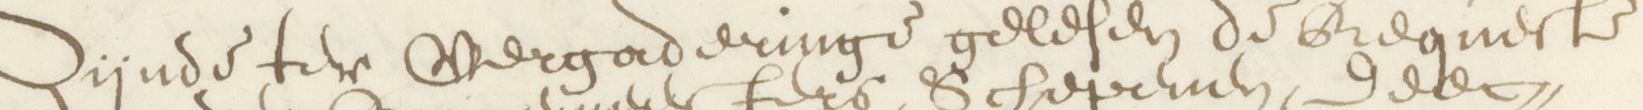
Sijnde ter Vergaderinge gelesen de Requeste
